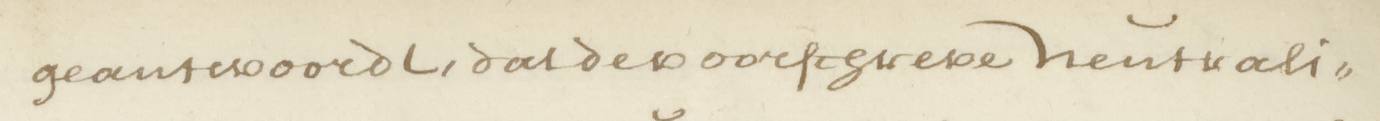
geantwoordt, dat de voorschreve Neutrali„
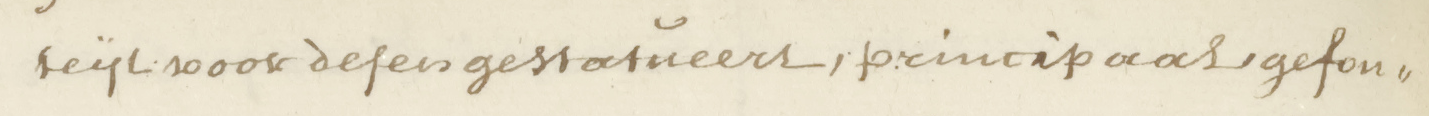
teijt voor desen gestatueert, principaal gefon„
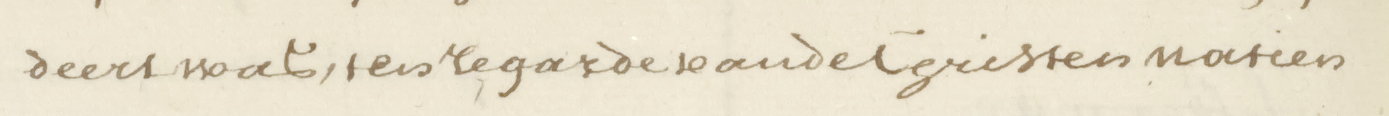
deert was, ten regarde vande Christen natien
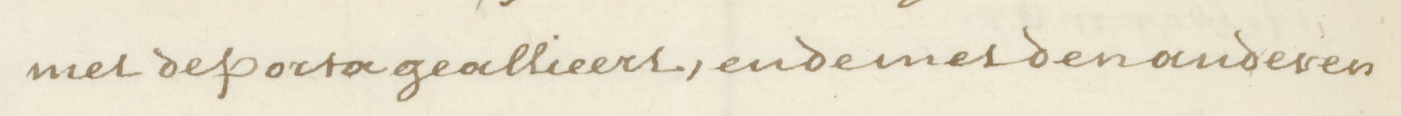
met deporta geallieert, ende met den anderen
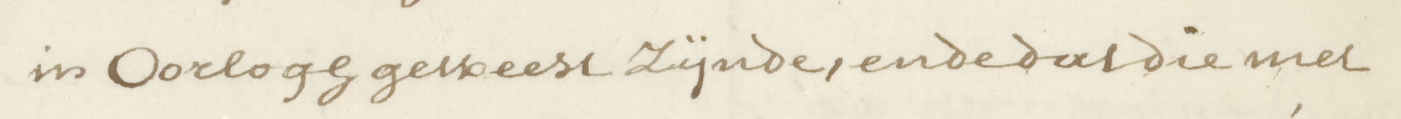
in Oorlogh geweest zijnde, ende dat die met
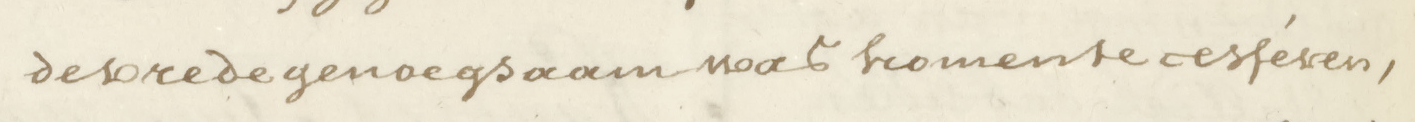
de vrede genoegsaam was komen te cesseren,
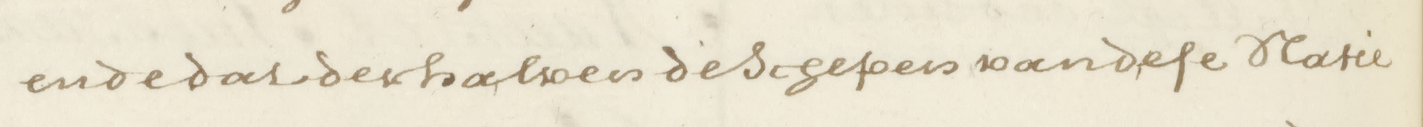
ende dat derhalven de schepen van dese Natie
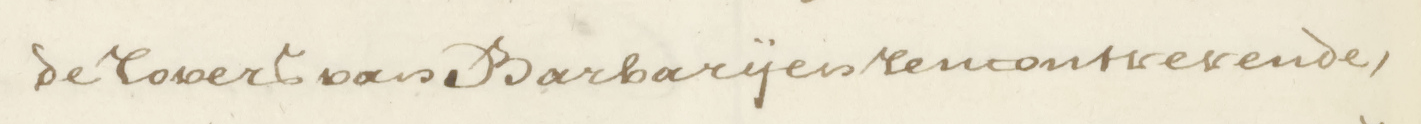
de Rovers van Barbarijen rencontrerende,
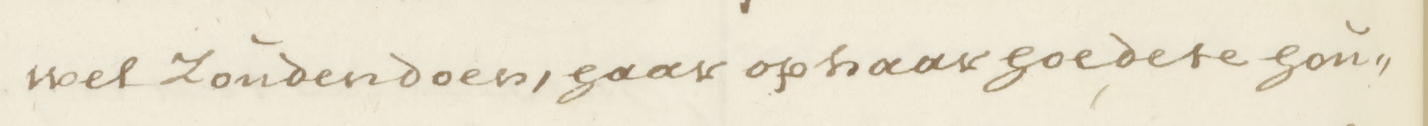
wel zouden doen, haar op haar hoede te hou„
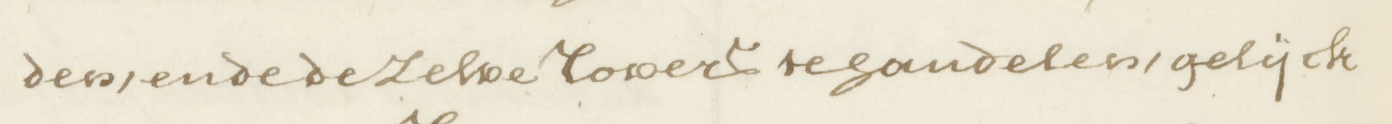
den, ende dezelve Rovers te handelen, gelijck
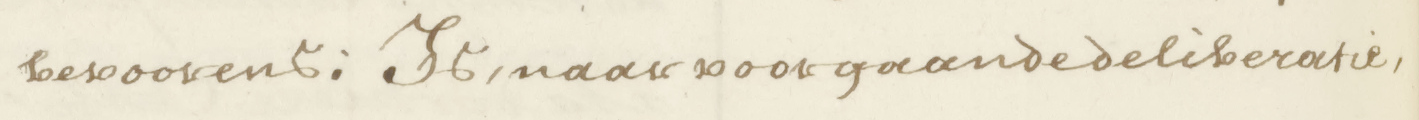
bevoorens: Is, naar voorgaande deliberatie,
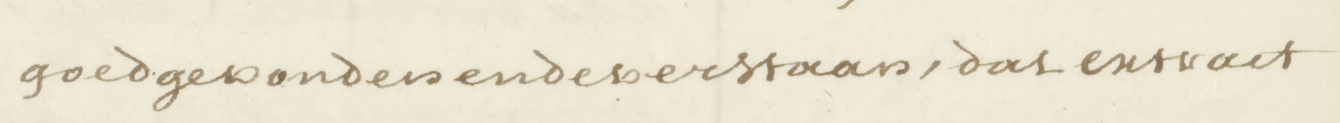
goedgevonden ende verstaan, dat extract
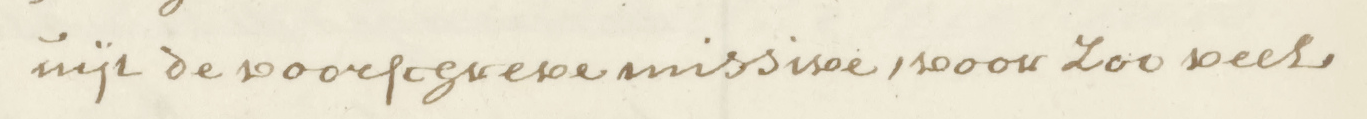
uijt de voorschreve missive, voor zoo veel
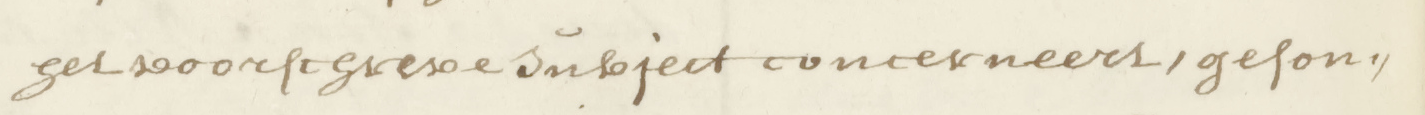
het voorschreve subject concerneert, geson„
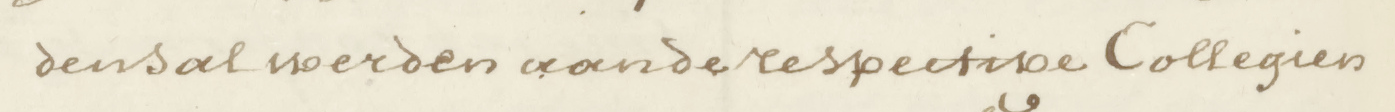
den sal werden aan de respective Collegien
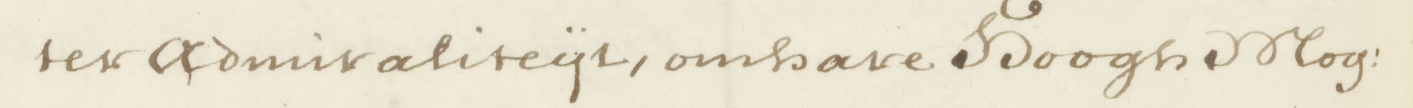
ter Admiraliteijt, om hare Hoogh Mog:
